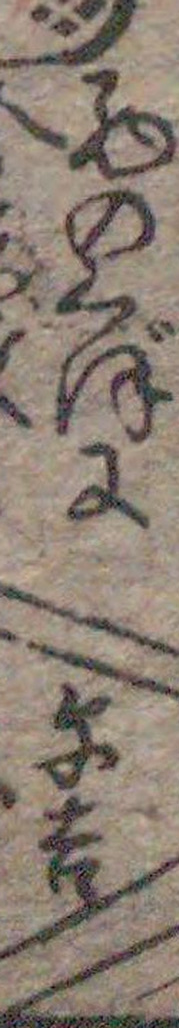西のくぼに
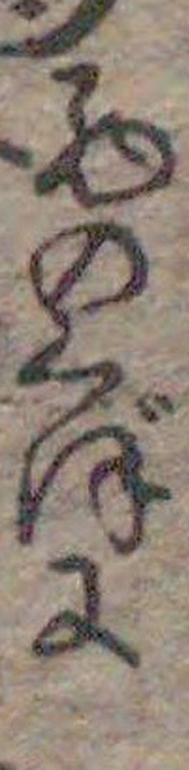西のくぼに
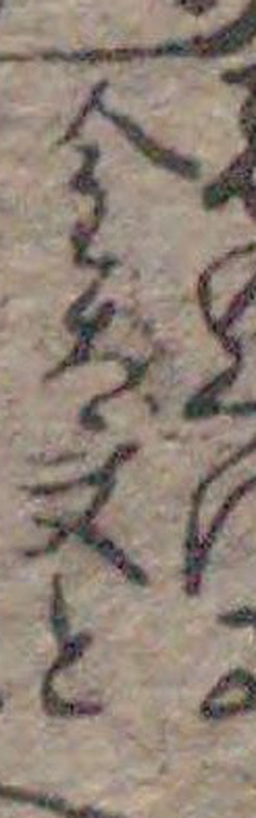金太夫と
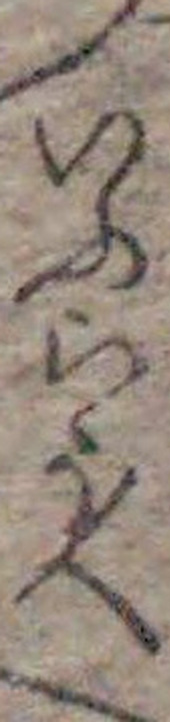いふらう人
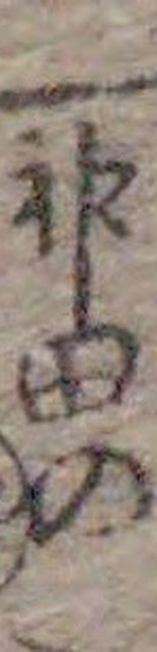神田の
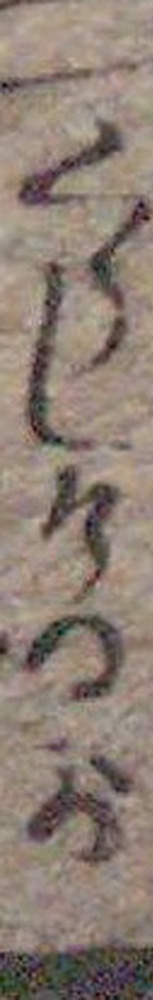くらしけるか
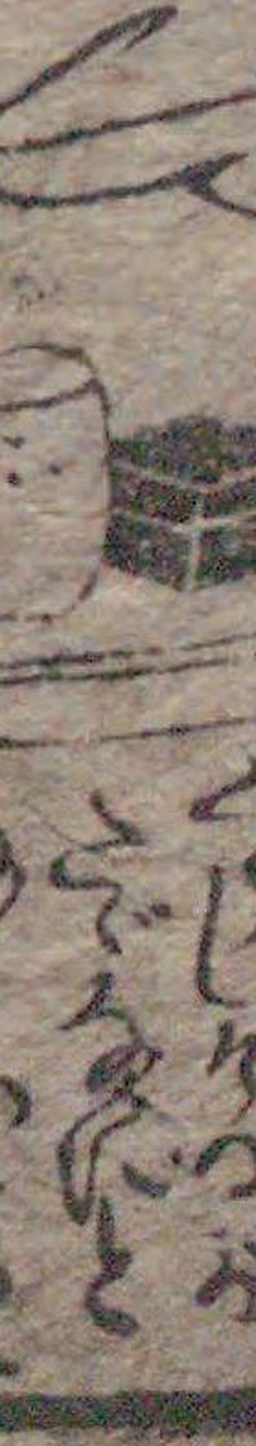たゞなにと
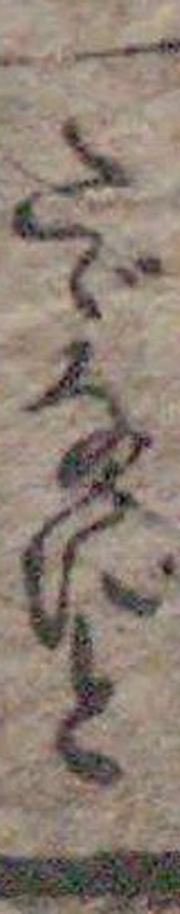たゞなにと
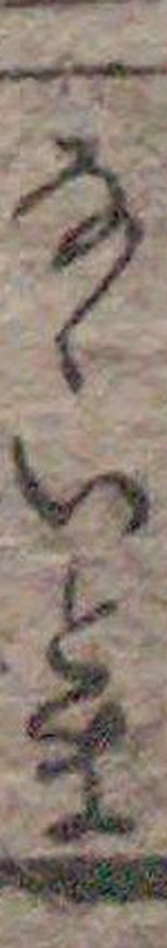なくいとま
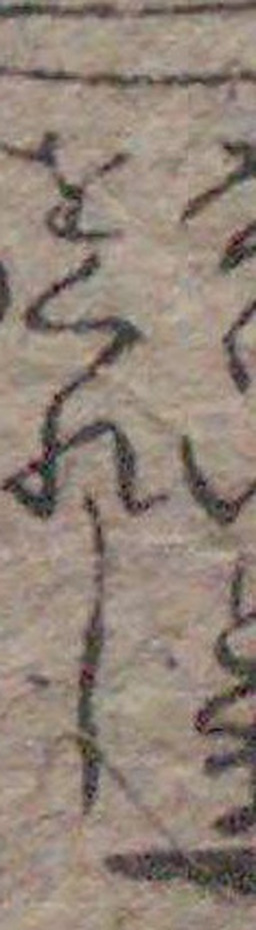をくれし
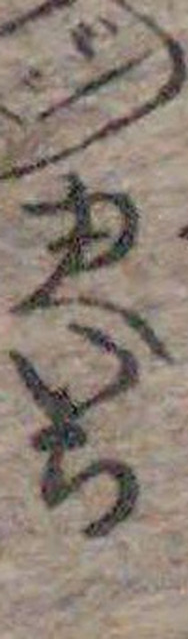ゆへいち
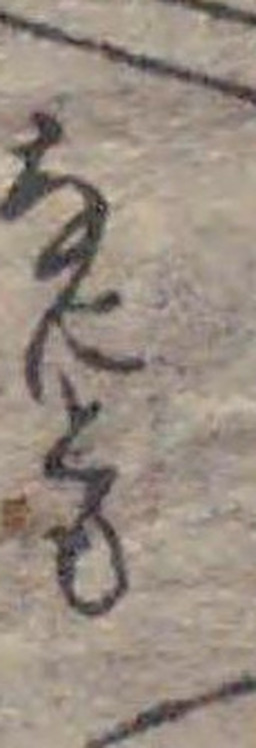なにとも
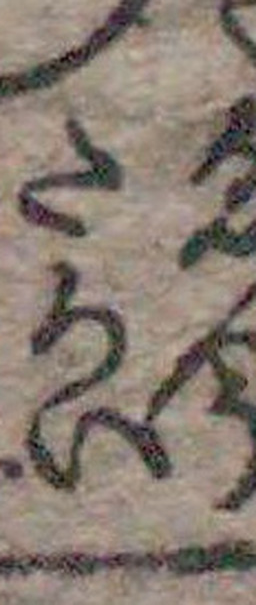たかい
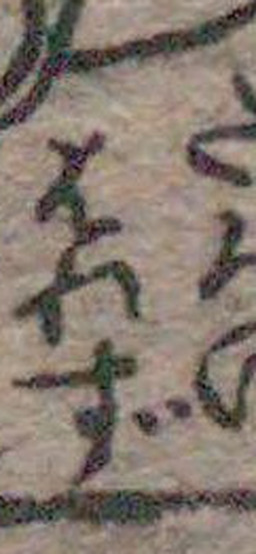はれず
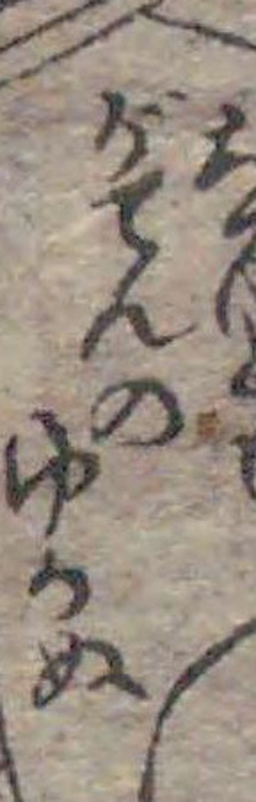がてんのゆかぬ
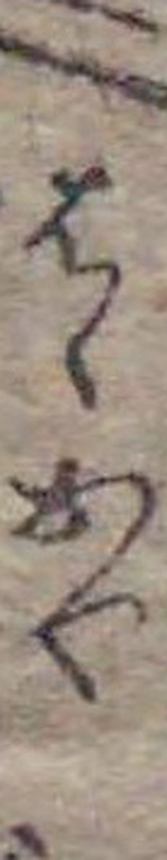はゝおや
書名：神田与吉一代記 : 3巻
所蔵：国立国会図書館 National Diet Library, JAPAN
